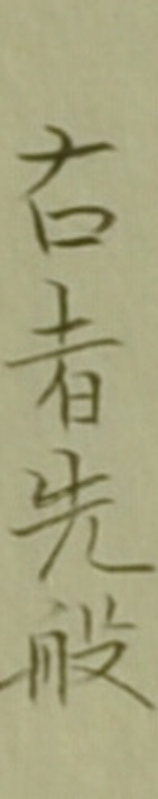右者先般
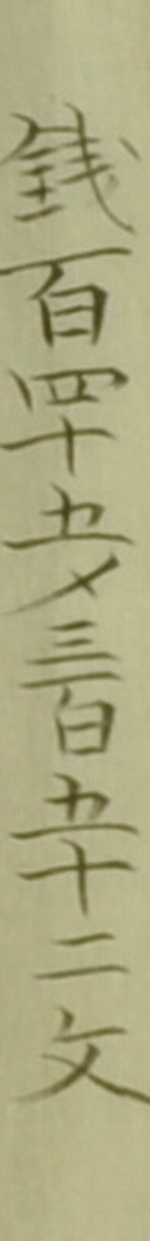銭百四十五貫三百五十二文
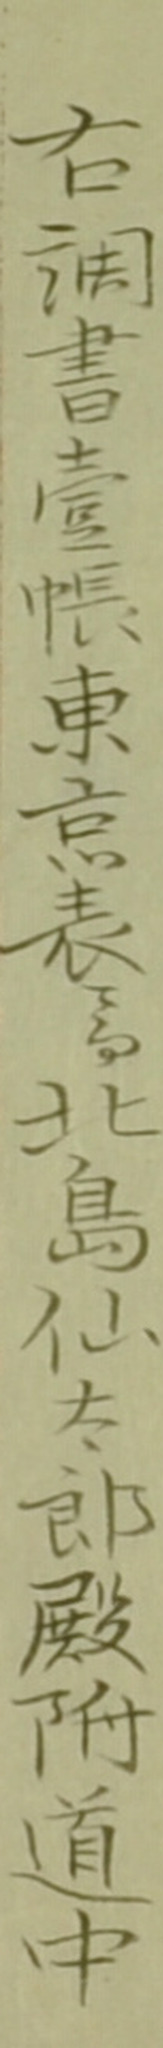右調書台帳東京表ニ而北島仙太郎殿附道中
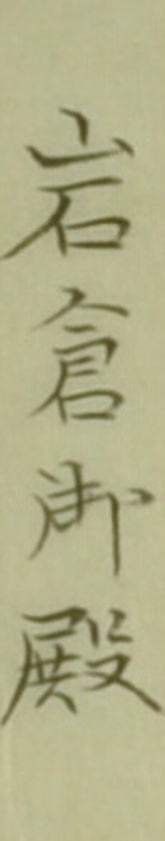岩倉御殿
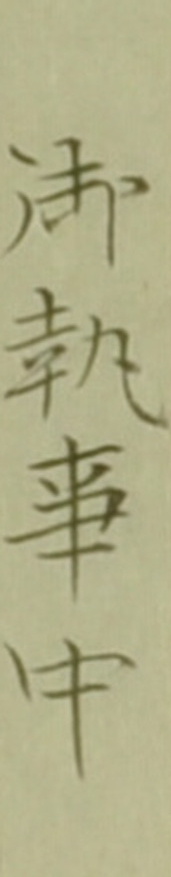御執事中
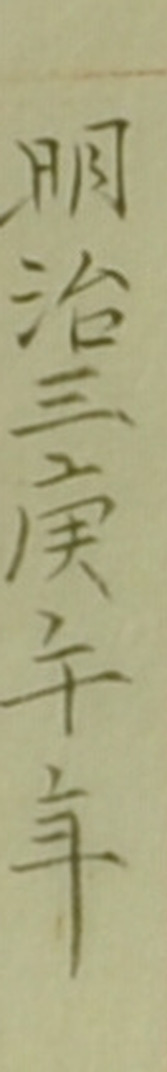明治三庚午年
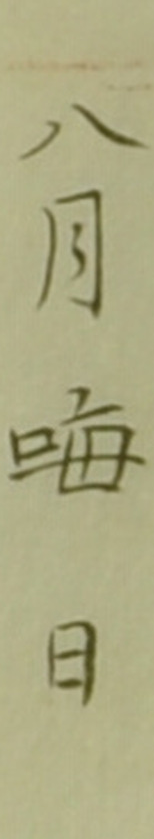八月晦日

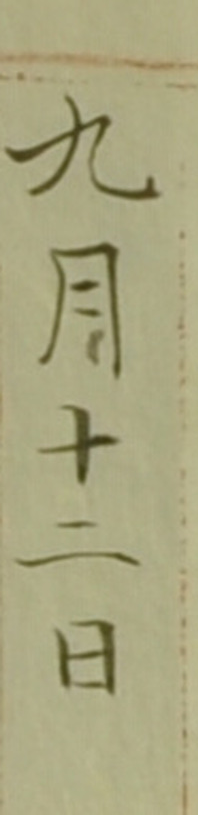九月十二日
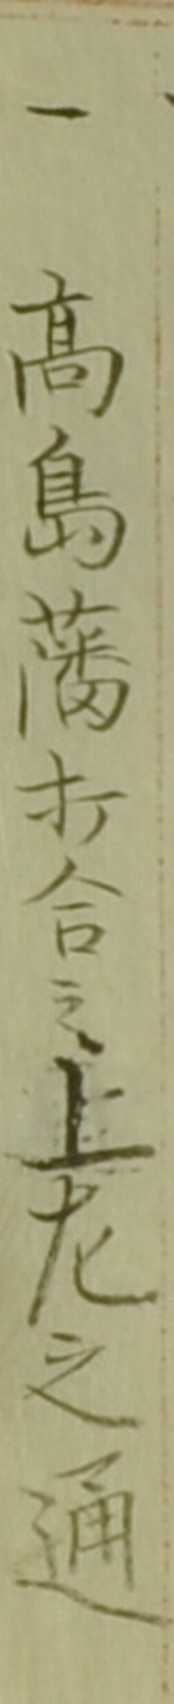一高島藩打合之上左之通
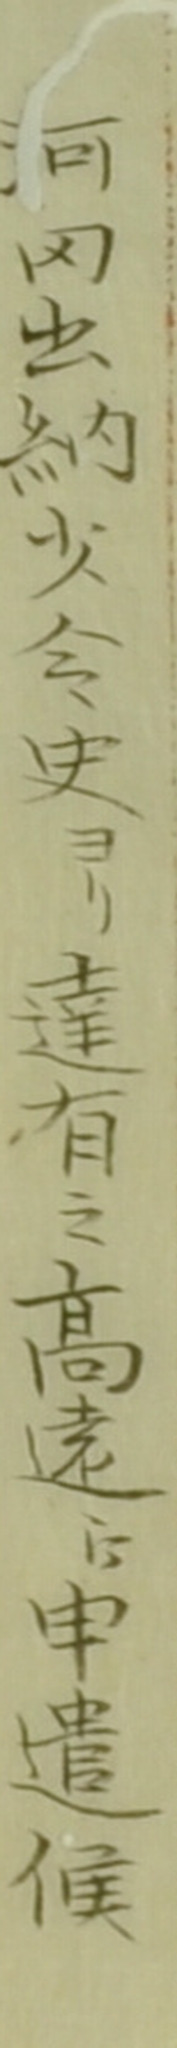河田出納少令史ヨリ達有之高遠江申遣候
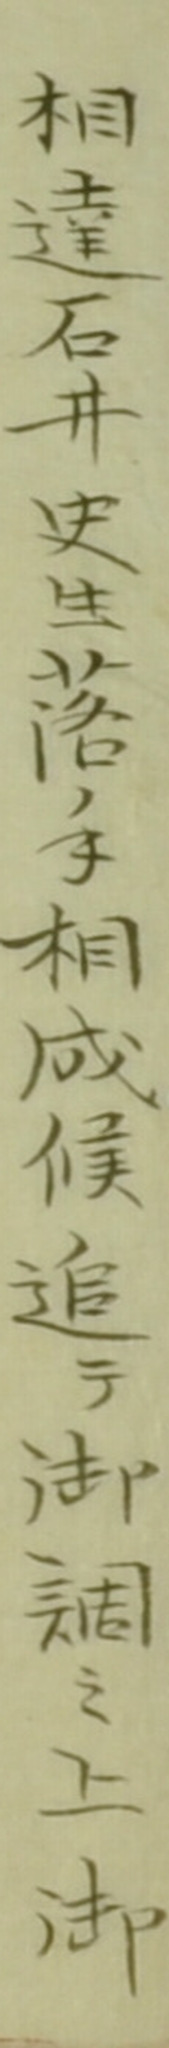相達石井史生落手相成候追テ御調之上御
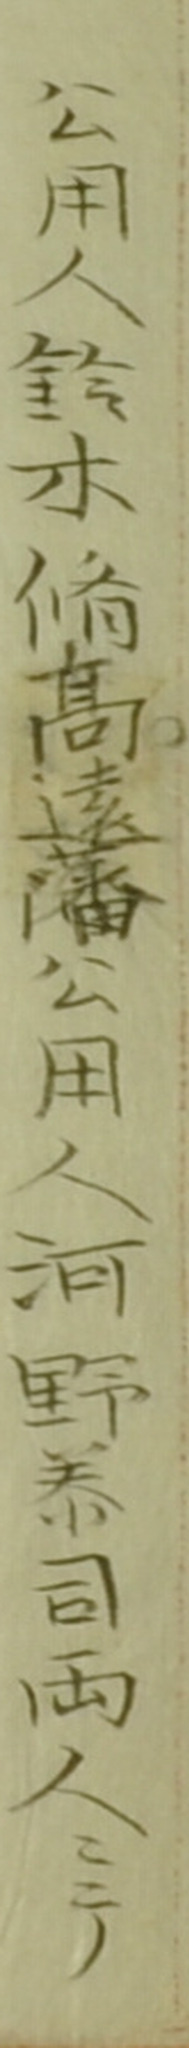公用人鈴木脩高遠藩公用人河野泰司両人ニテ
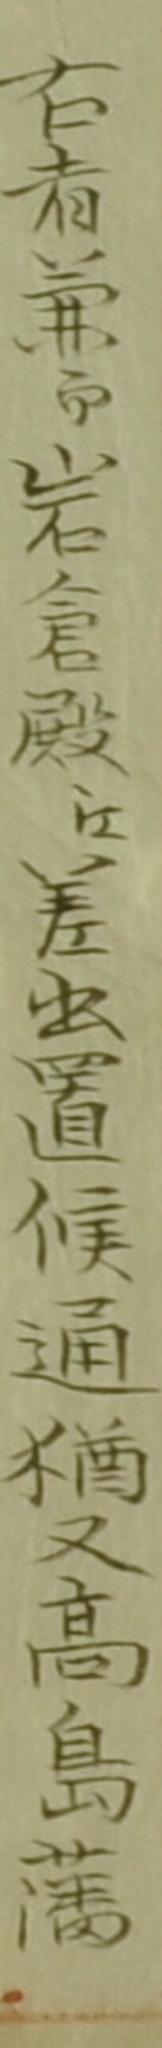右者兼而岩倉殿江差出置候通猶又高島藩
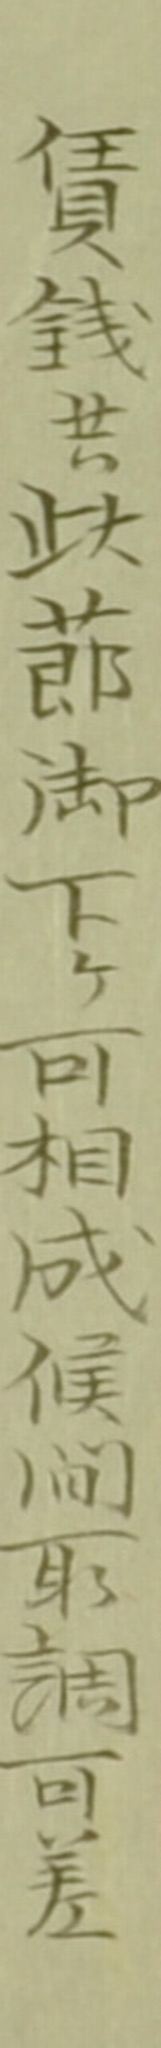賃銭共此節御下ゲ可相成候間取調可差
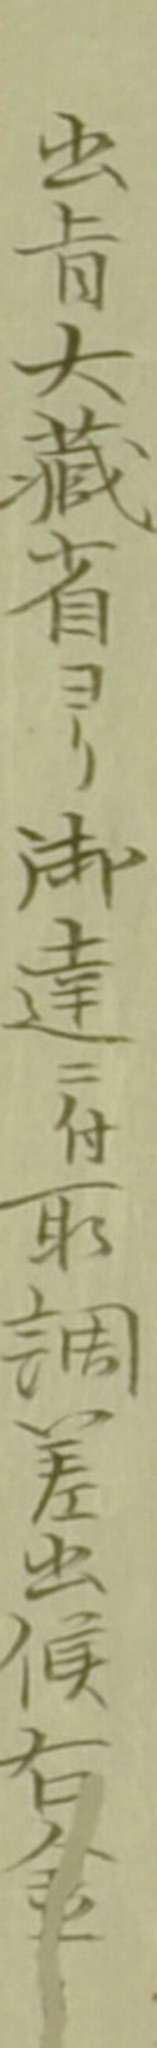出旨大蔵省ヨリ御達ニ付取調差出候右金
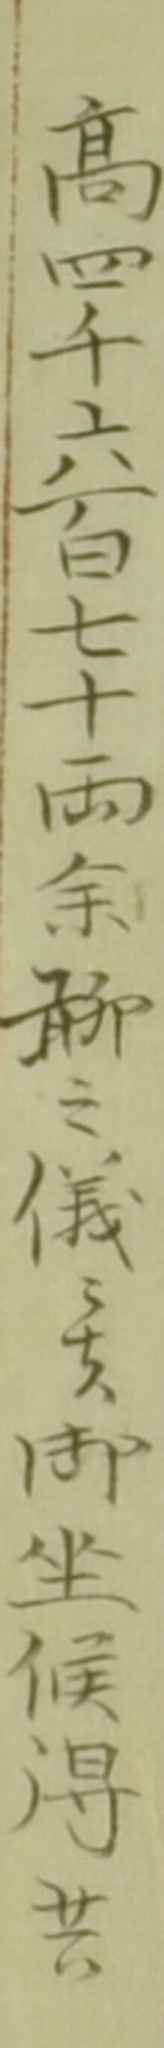高四千六百七十両余聊之儀ニ者御坐候得共
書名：御東征ニ付甲州口兵食人馬御賄之事件（控）
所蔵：伊那市立高遠町図書館・合同会社AMANE
